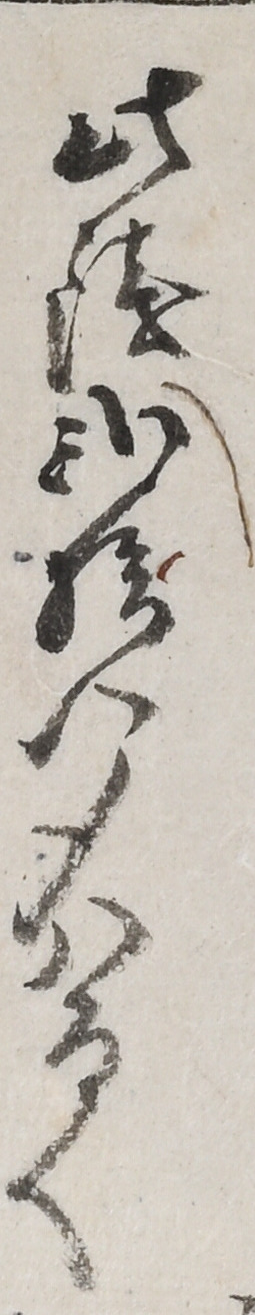此銭弐拾八〆八百文
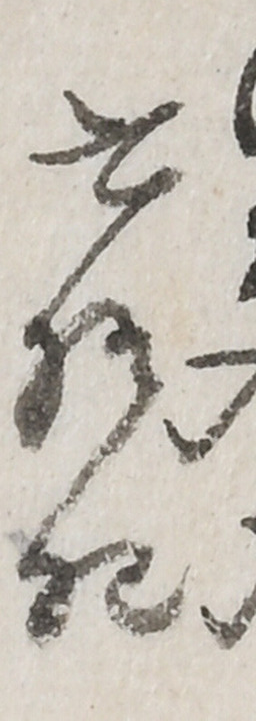六拾把
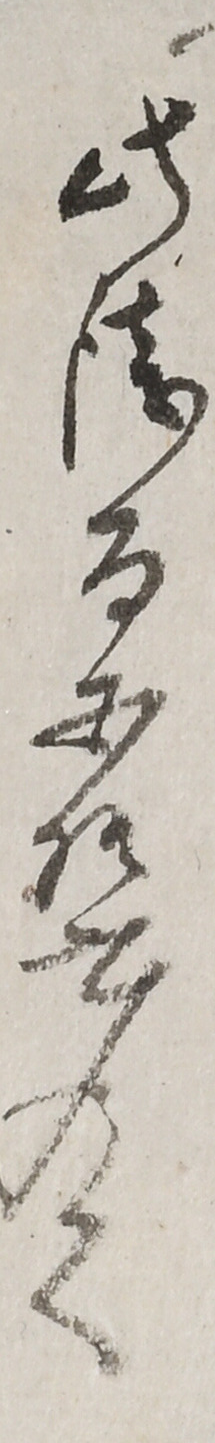此銭百五拾六〆文
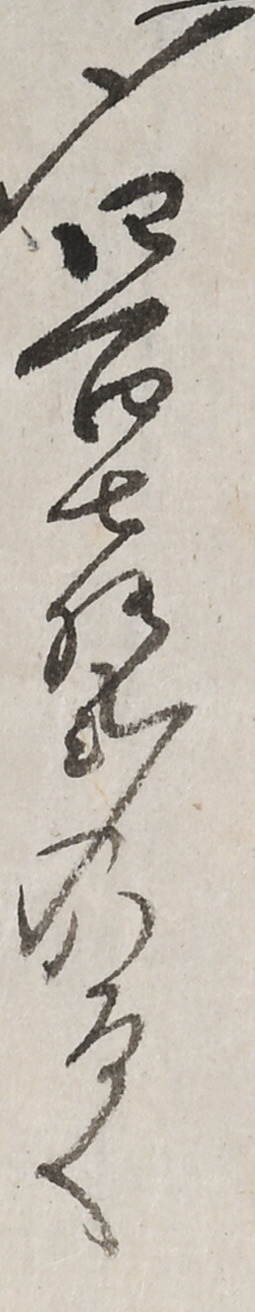〆四百七拾弐〆八百文
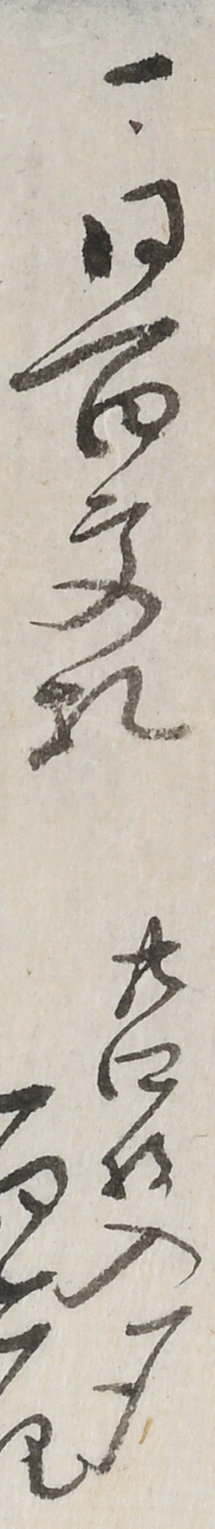一同百文札廿四枚入一〆
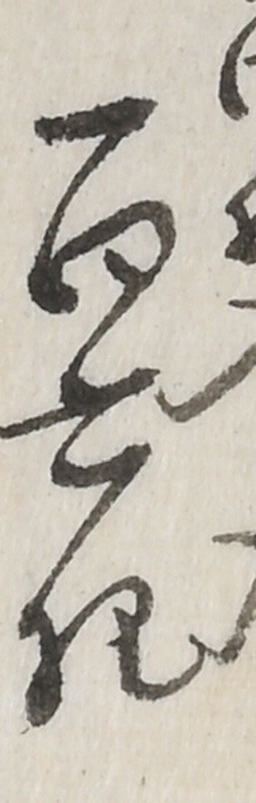百六把
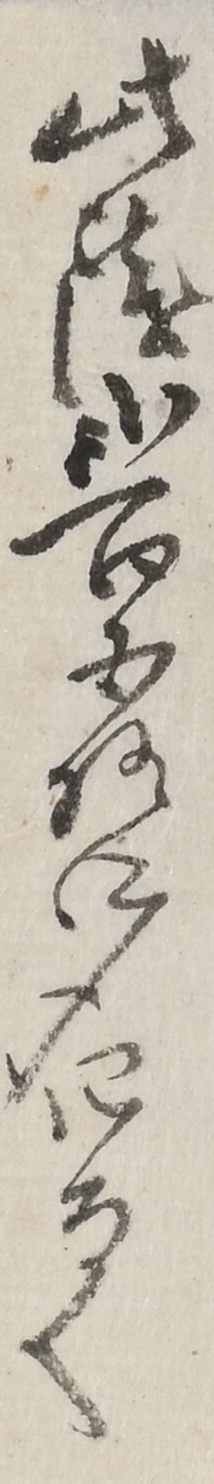此銭弐百五拾四〆四百文
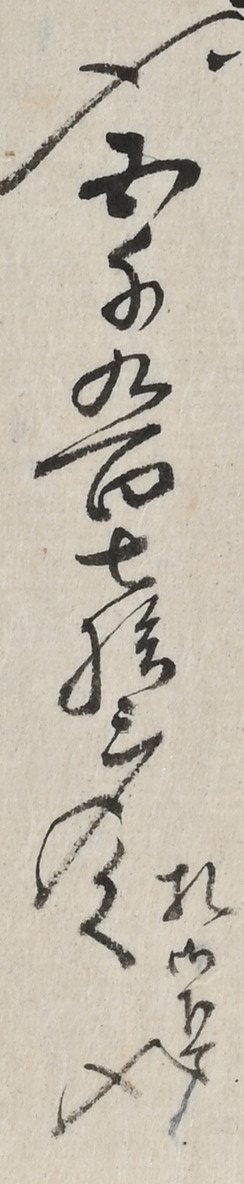〆五千九百七拾三〆文〆
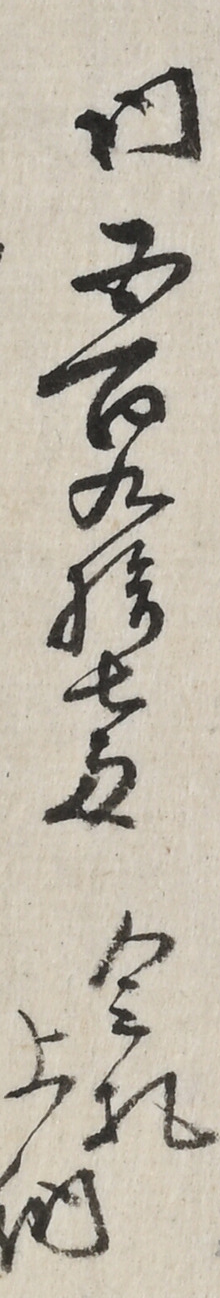内五百九拾七両金札
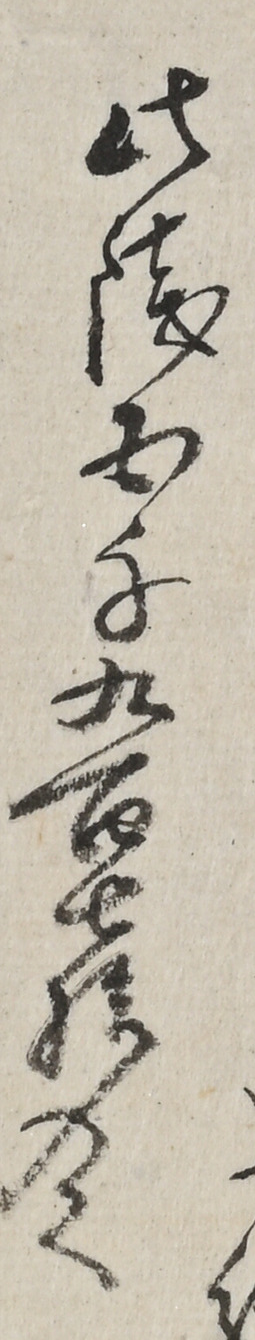此銭五千九百七拾〆文
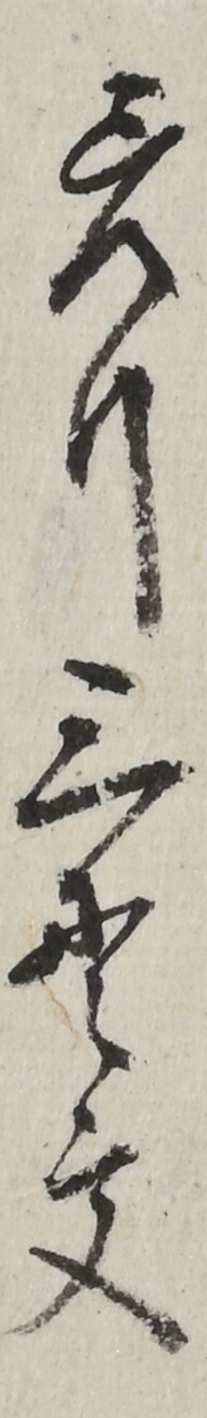差引三貫文
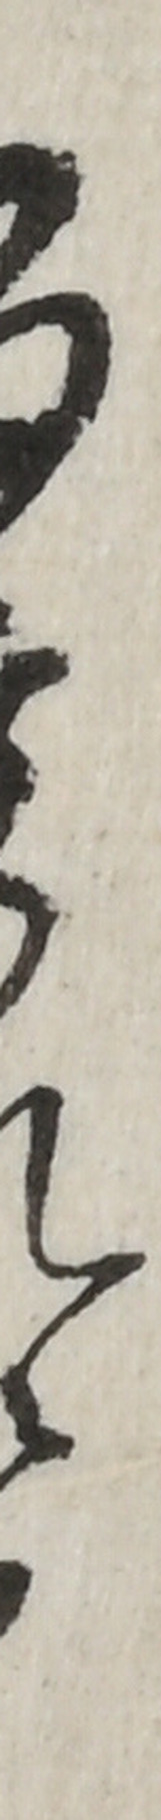百文札ニ而

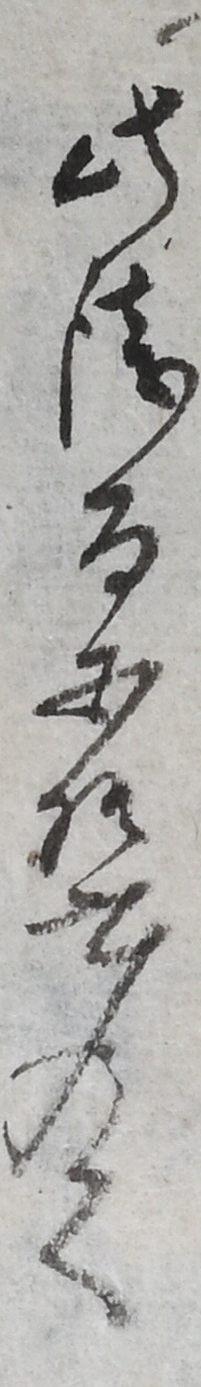此銭百五拾六〆文
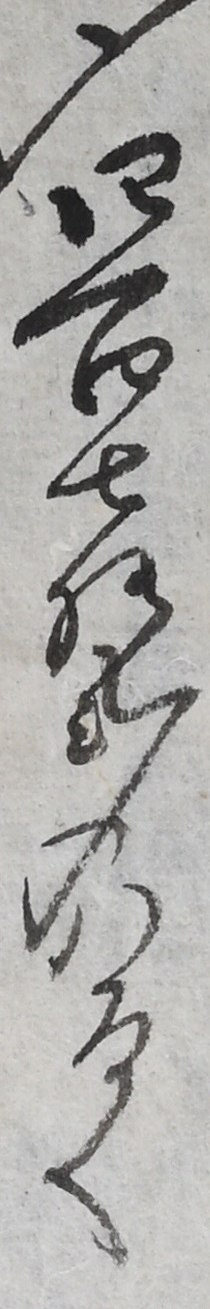〆四百七拾弐〆八百文
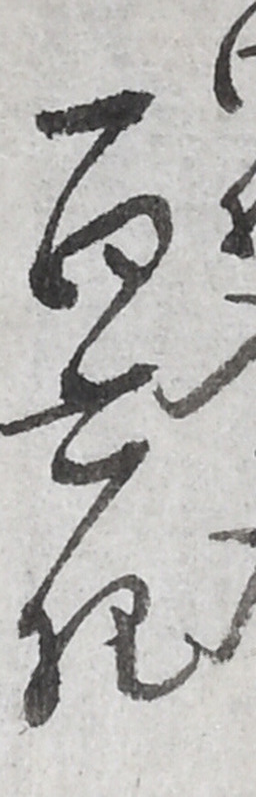百六把
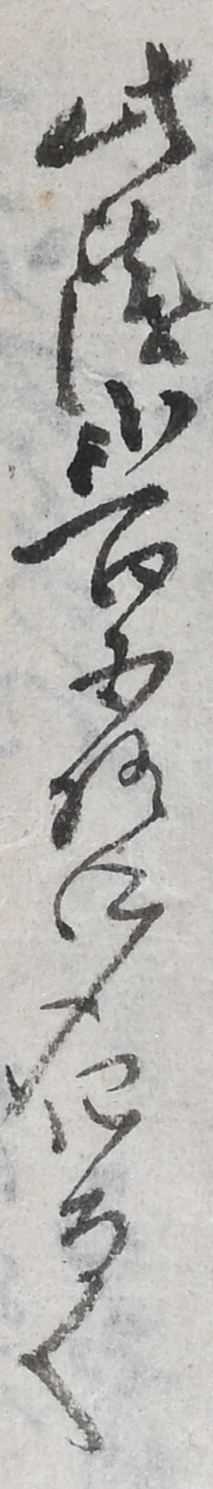此銭弐百五拾四〆四百文
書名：信濃全國楮幣引換御用控
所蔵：伊那市立高遠町図書館・合同会社AMANE
